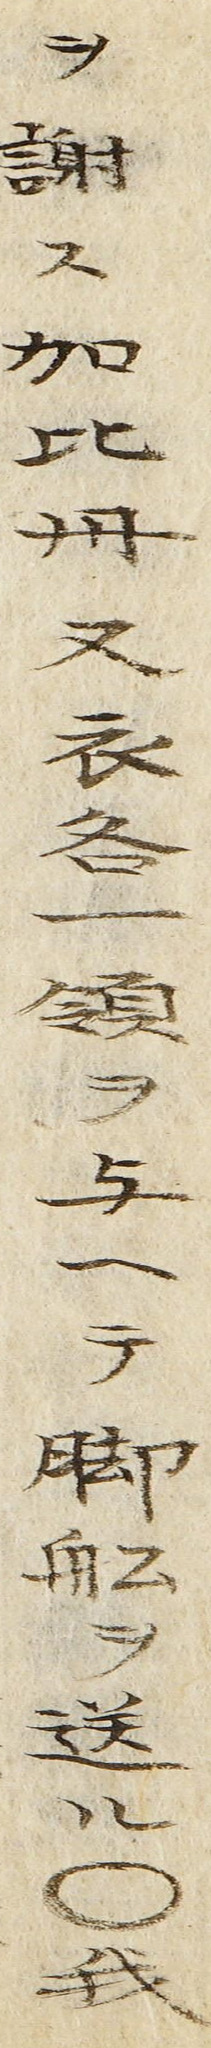ヲ謝ス加比丹又衣各一領ヲ与ヘテ脚船ヲ送ル◯我
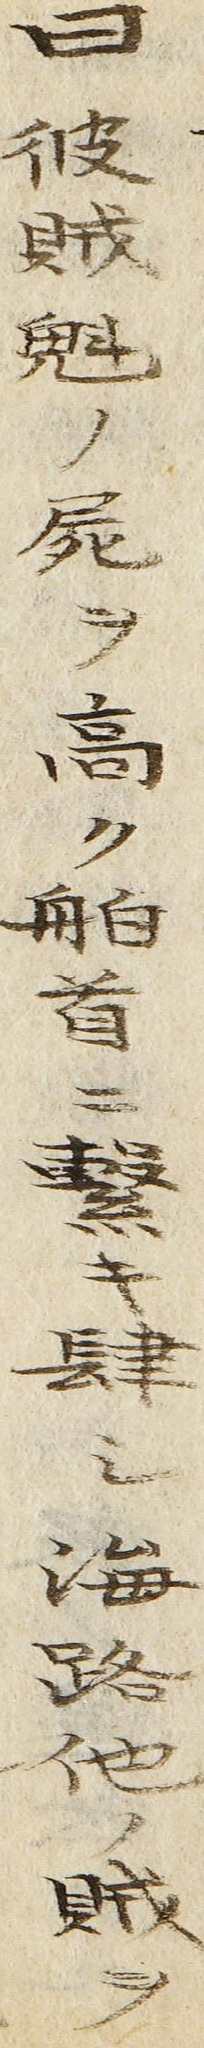曰彼賊魁ノ屍ヲ高ク舶首ニ繋キ肆シ海路他ノ賊ヲ
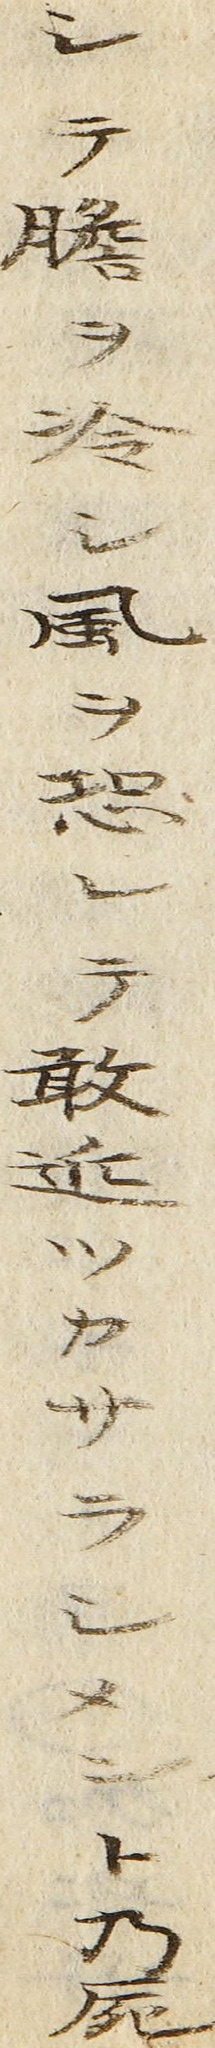シテ胆ヲ冷シ風ヲ恐レテ敢近ツカサラシメント乃屍
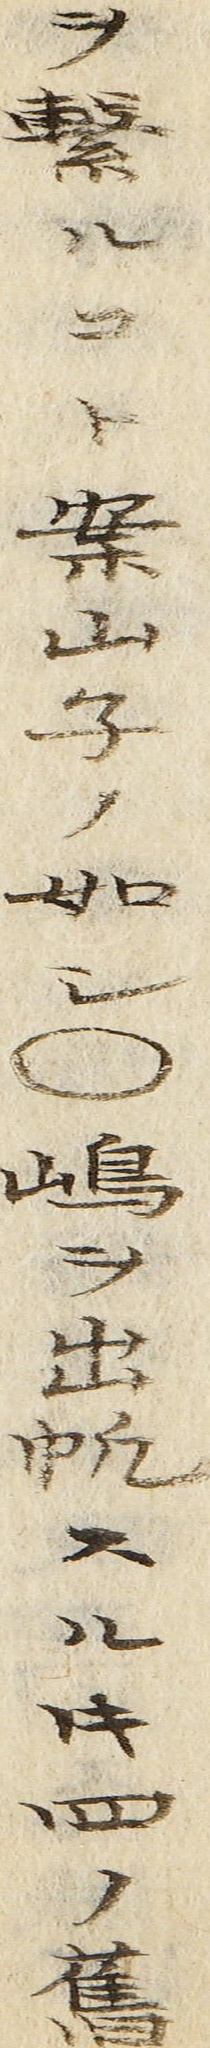ヲ繋ルコト案山子ノ如シ◯嶋ヲ出帆スルトキ四ノ旧
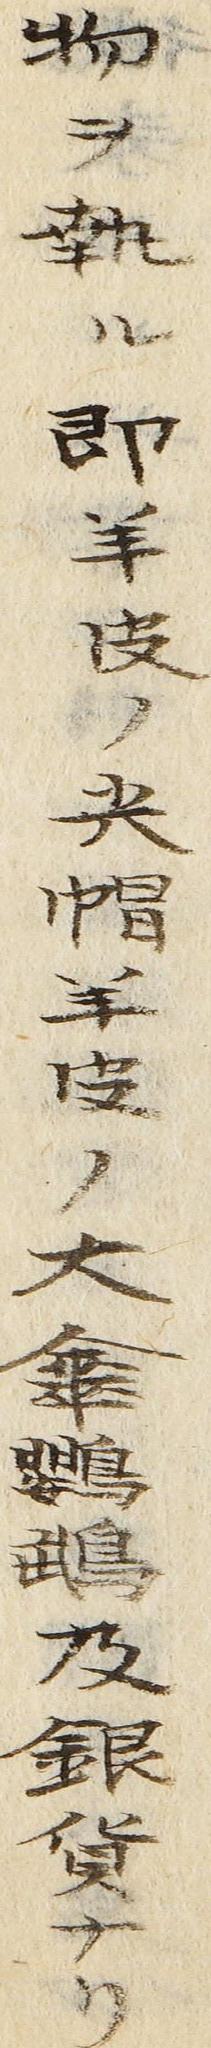物ヲ執ル即羊皮ノ尖帽羊皮ノ大傘鸚鵡及銀貨ナリ
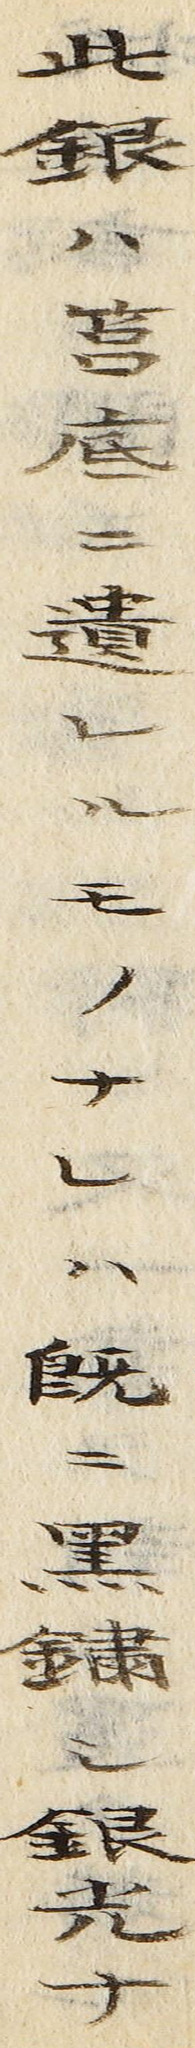此銀ハ筥底ニ遺レルモノナレハ既ニ黒鏽シ銀光ナ
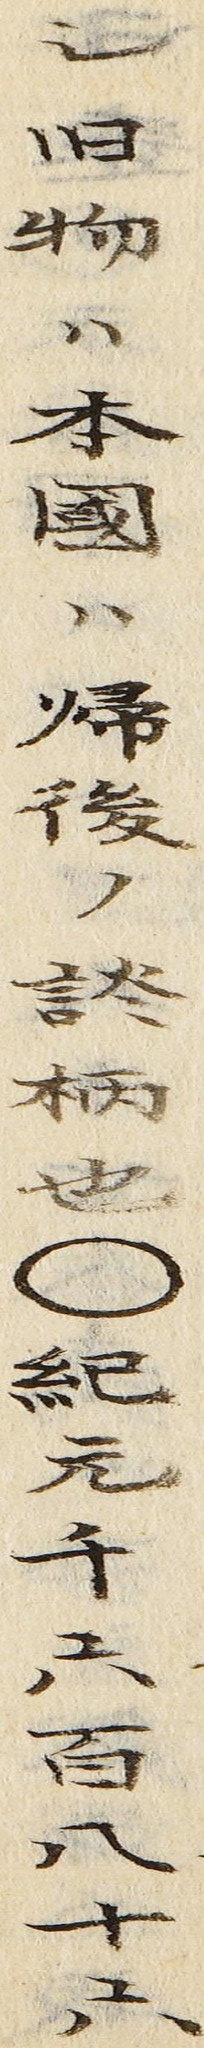シ旧物ハ本国ハ帰後ノ談柄也◯紀元千六百八十六
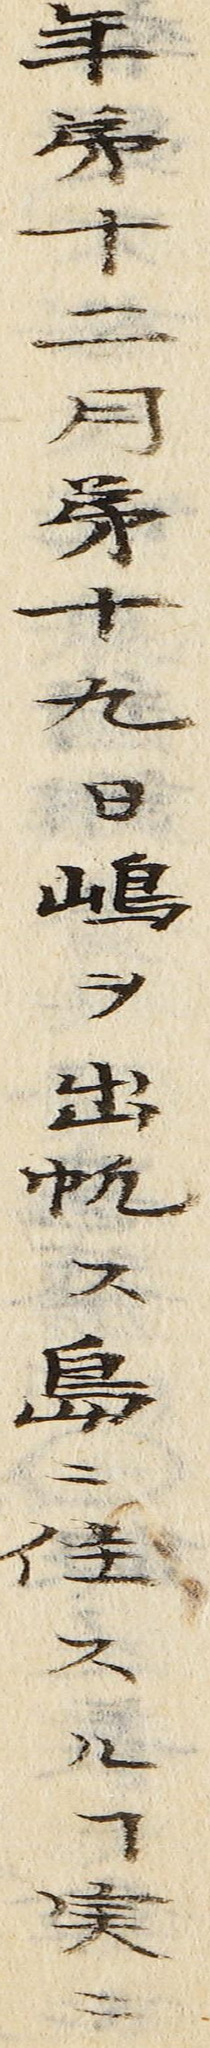年第十二月第十九日嶋ヲ出帆ス島ニ住スルコト実ニ
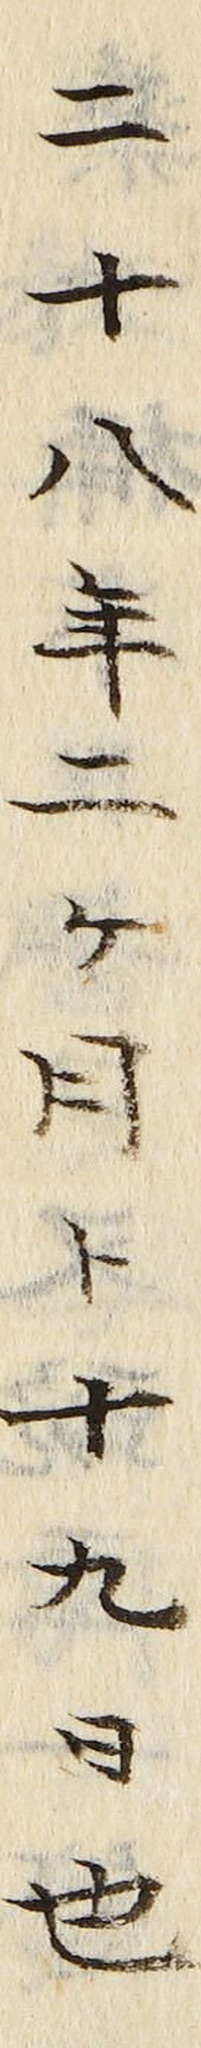二十八年二ヶ月ト十九日也
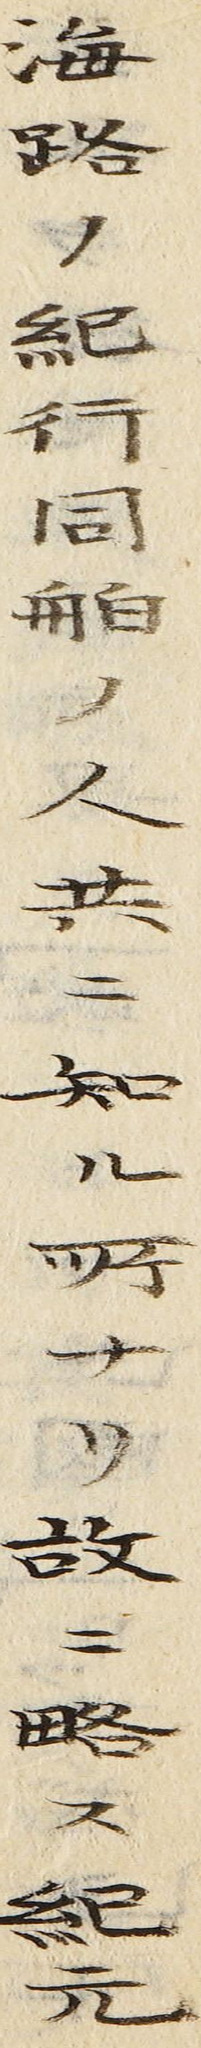海路ノ紀行同舶ノ人共ニ知ル所ナリ故ニ略ス紀元
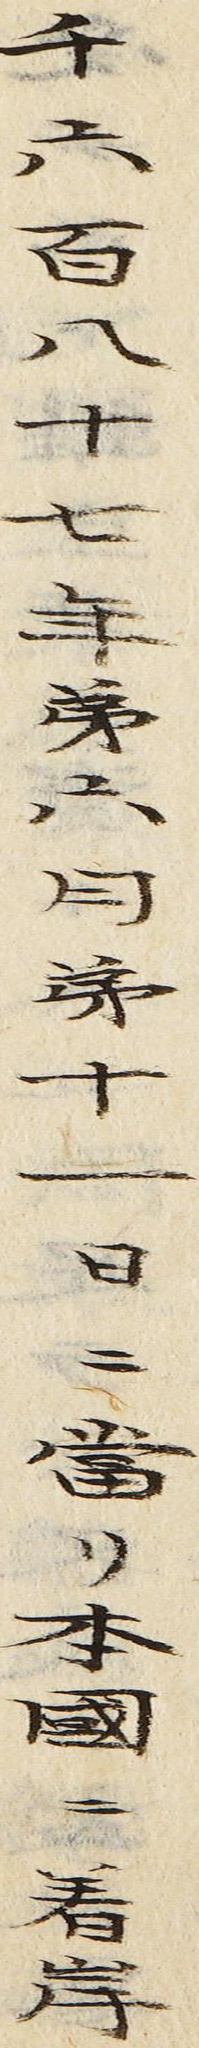千六百八十七年第六月第十一日ニ当リ本国ニ着岸
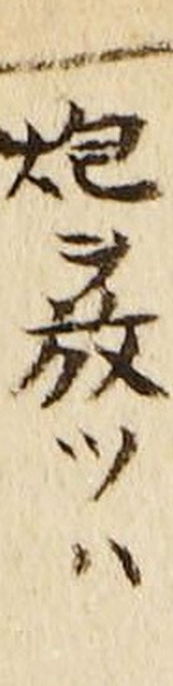炮ヲ放ツハ
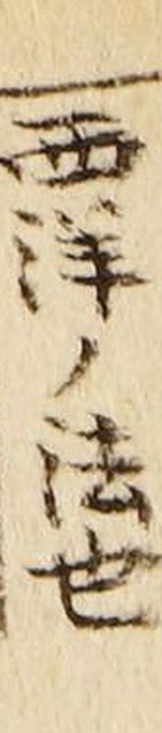西洋ノ法也
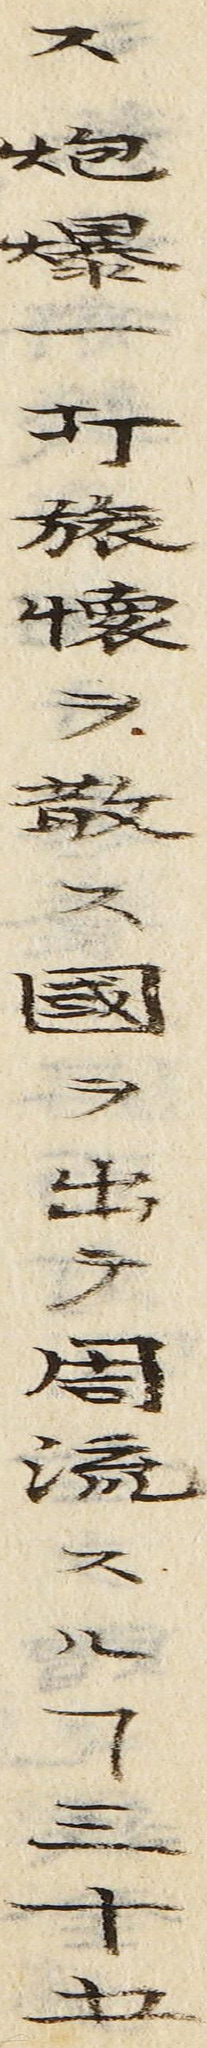ス炮爆一打旅懐ヲ散ス国ヲ出テ周流スルコト三十五
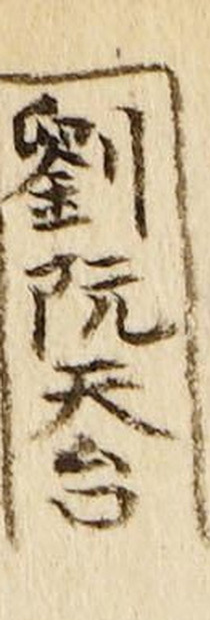劉阮天台
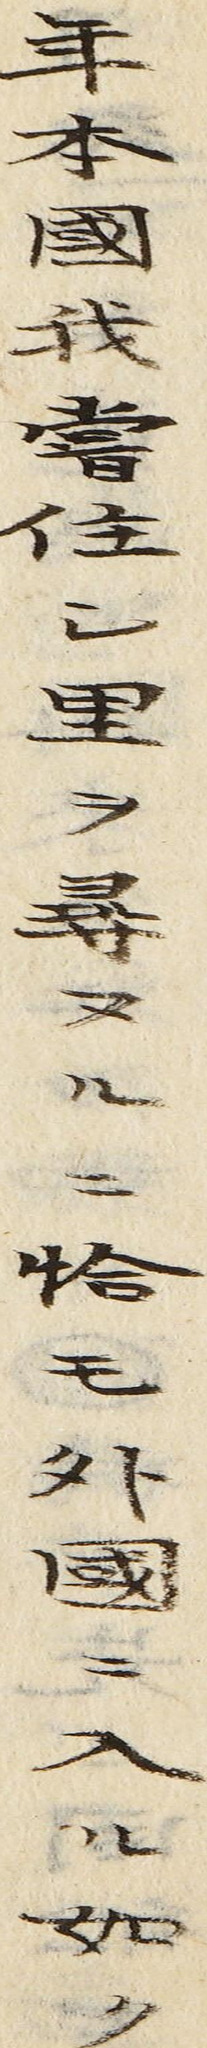年本国我嘗住シ里ヲ尋ヌルニ恰モ外国ニ入ル如ク
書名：漂流紀事
